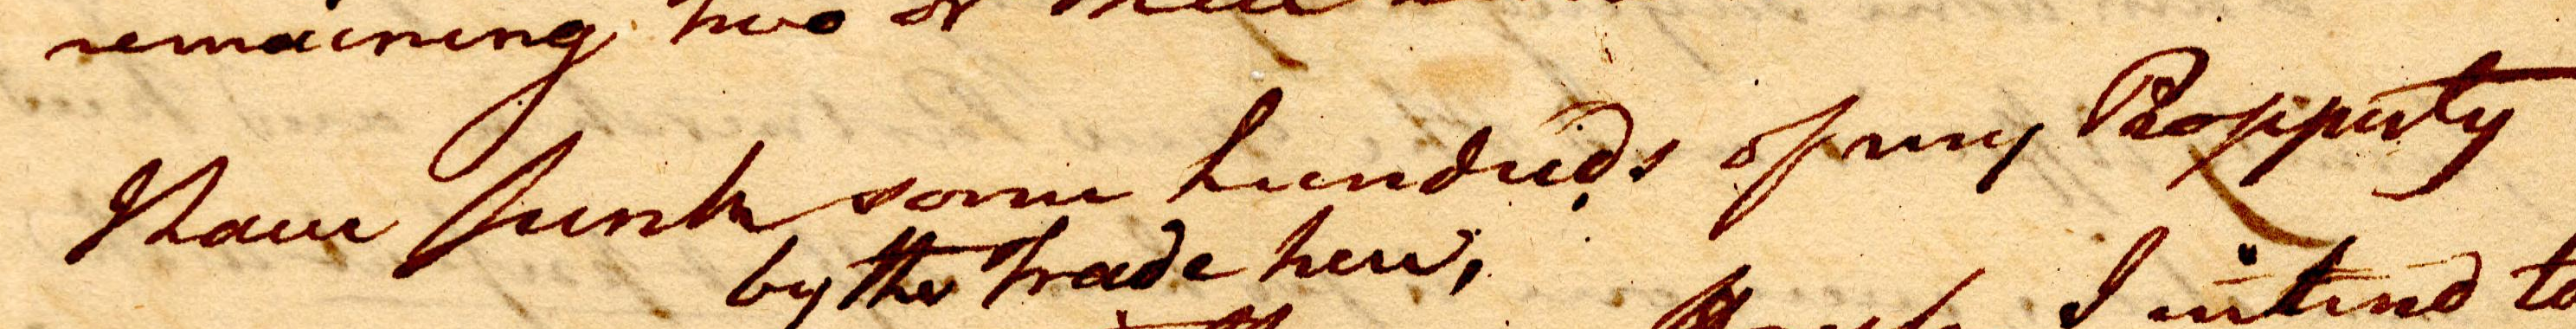I have sunk, some hundreds of my propperty
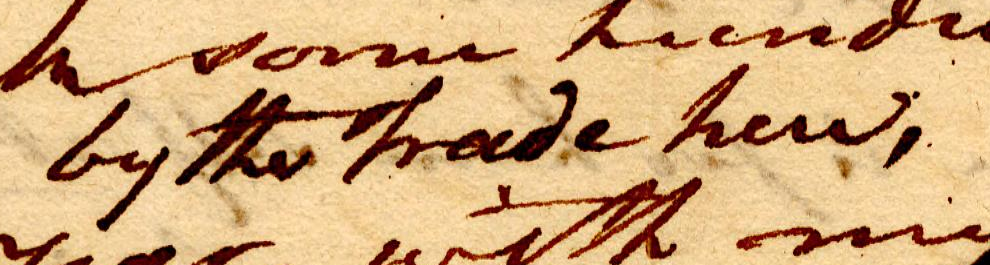by the Trade here,
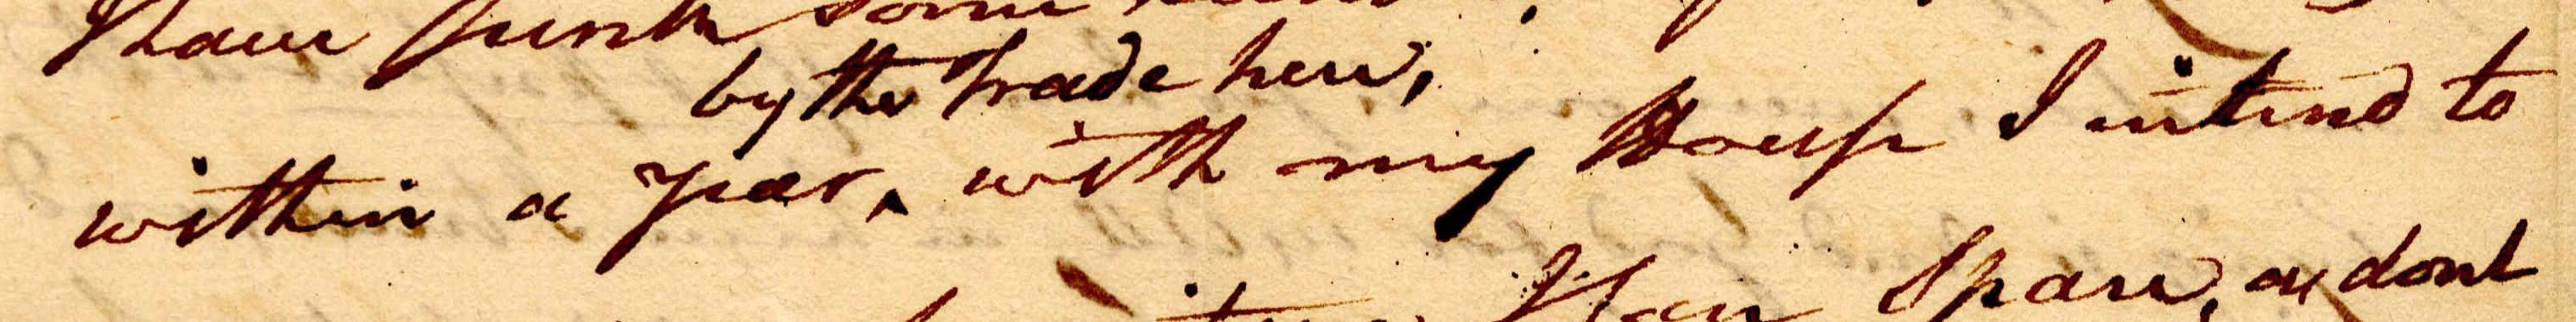within a year, with my House I intend to
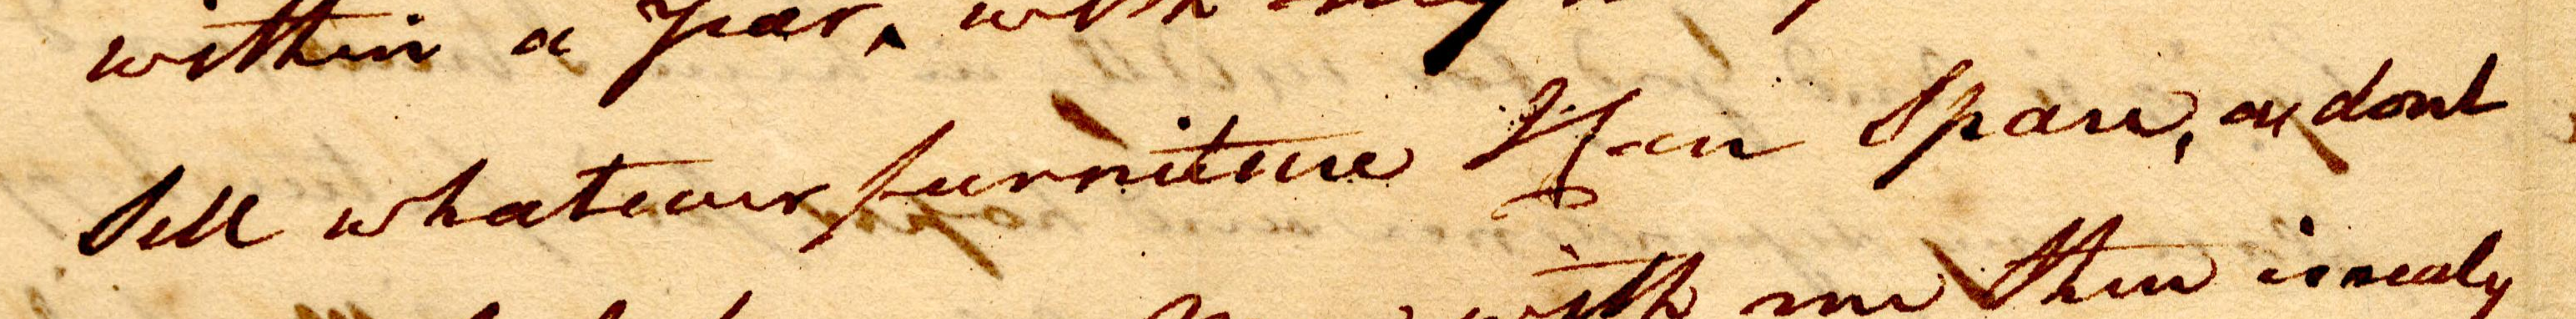Sell whatever furniture I can spare, as dont
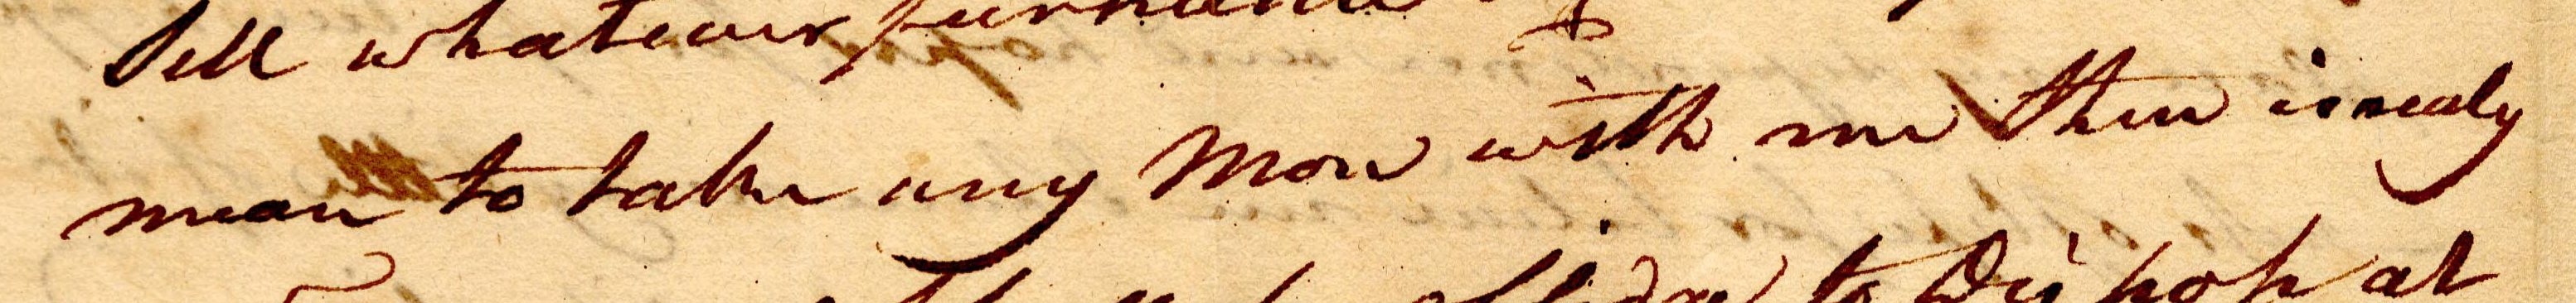mean to take my more with me then is realy
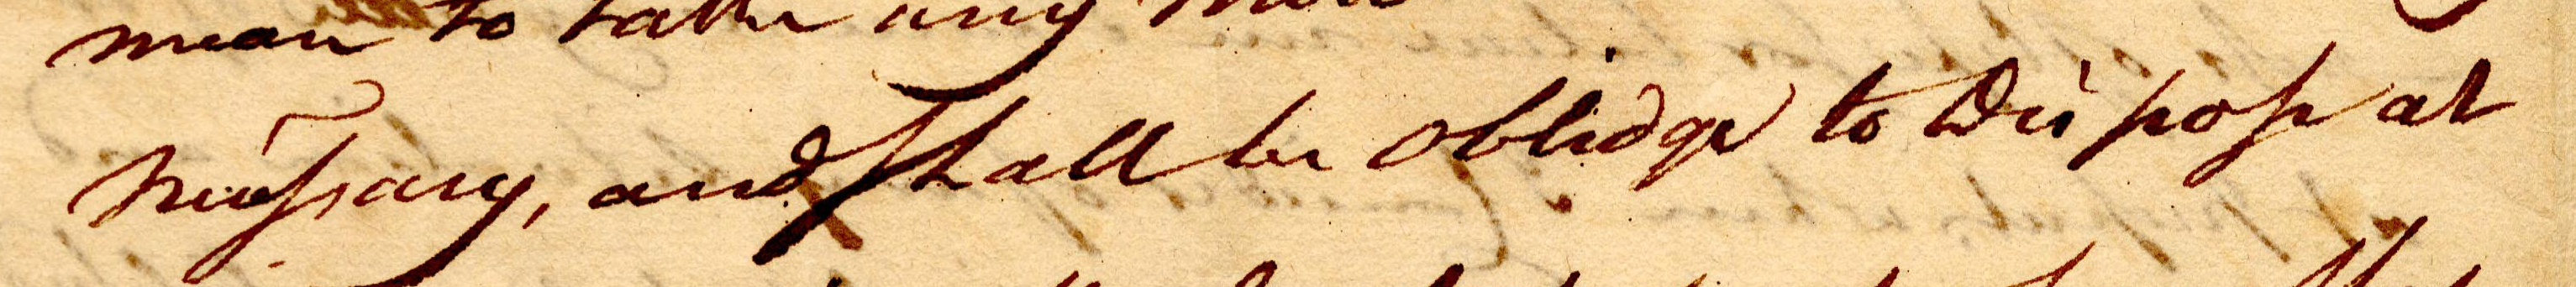necessary, and shall be oblidge to Dispose at
